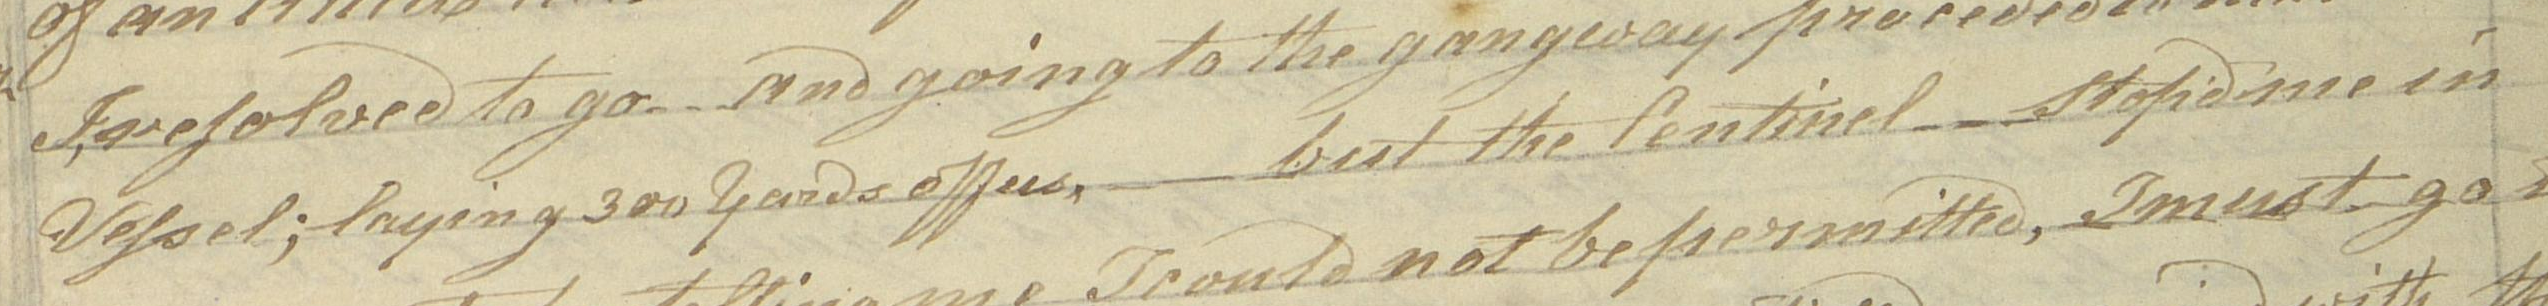Vessel; laying 300 Yards Off us, but the Centinel Stop'd me in
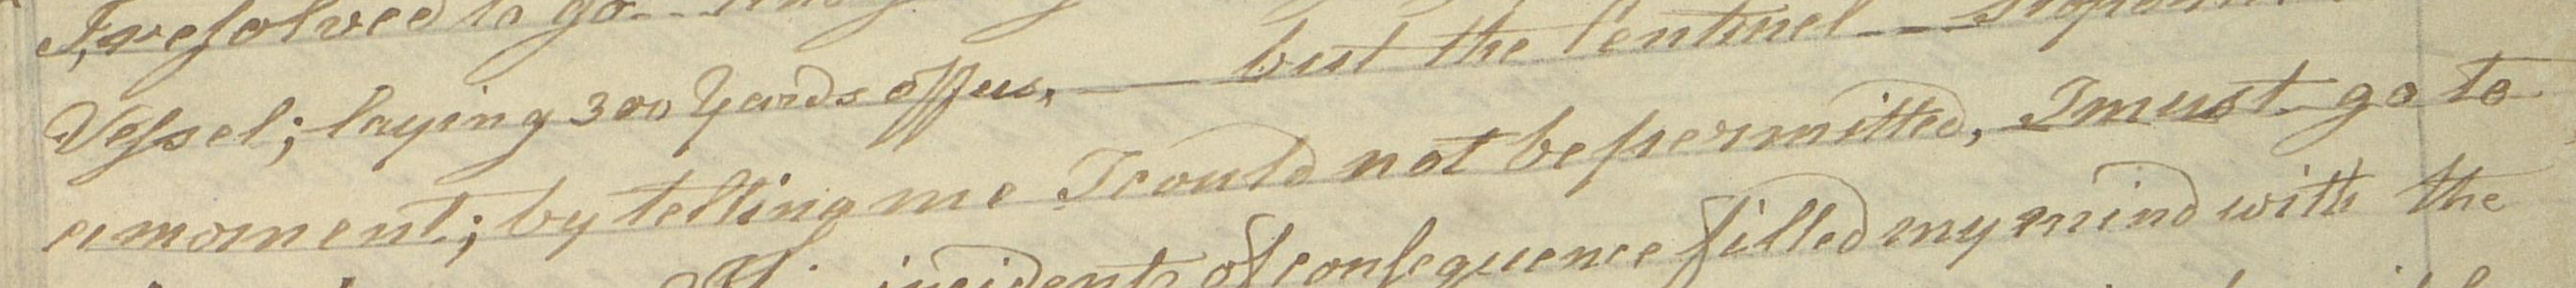a moment; by telling me I could not be permitted, I must go to
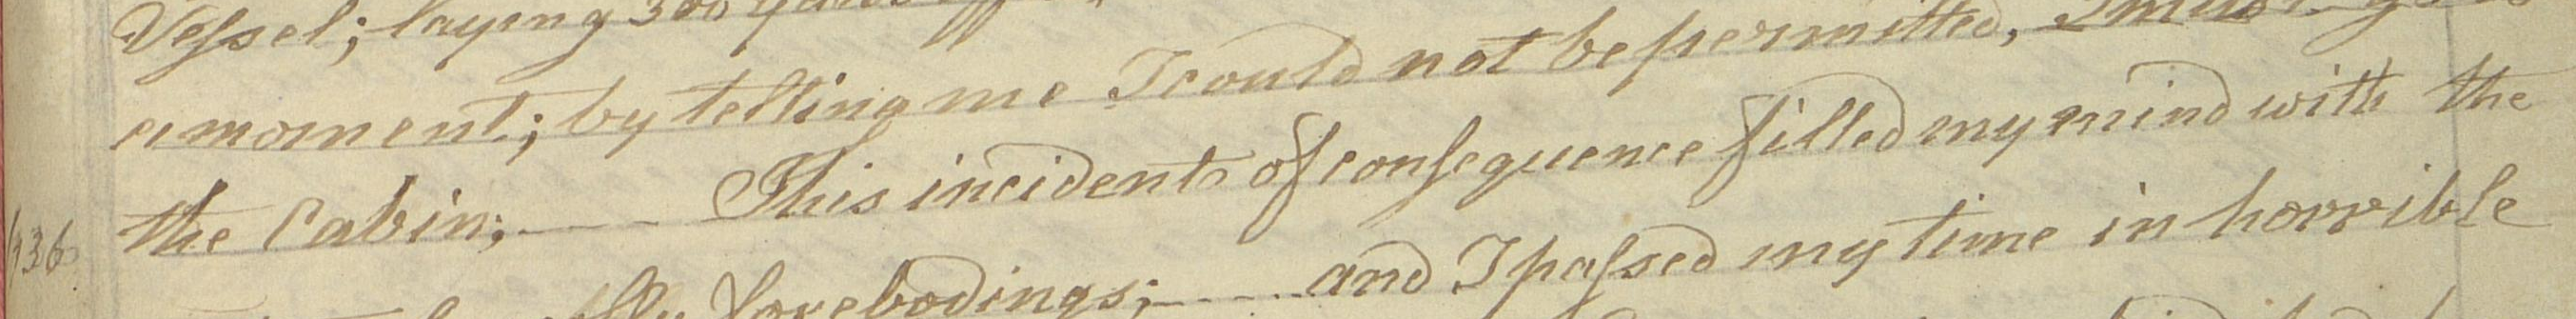p 36 the Cabin; This incident of consequence filled my mind with the
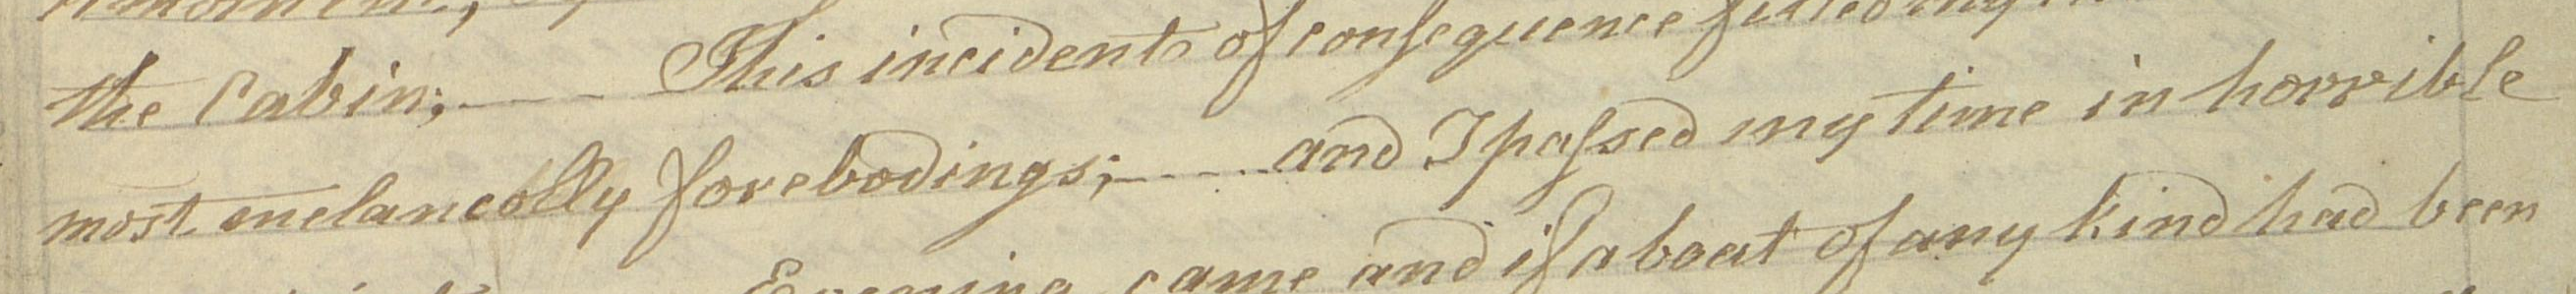most melancolly forebodings; and I passed my time in horrible
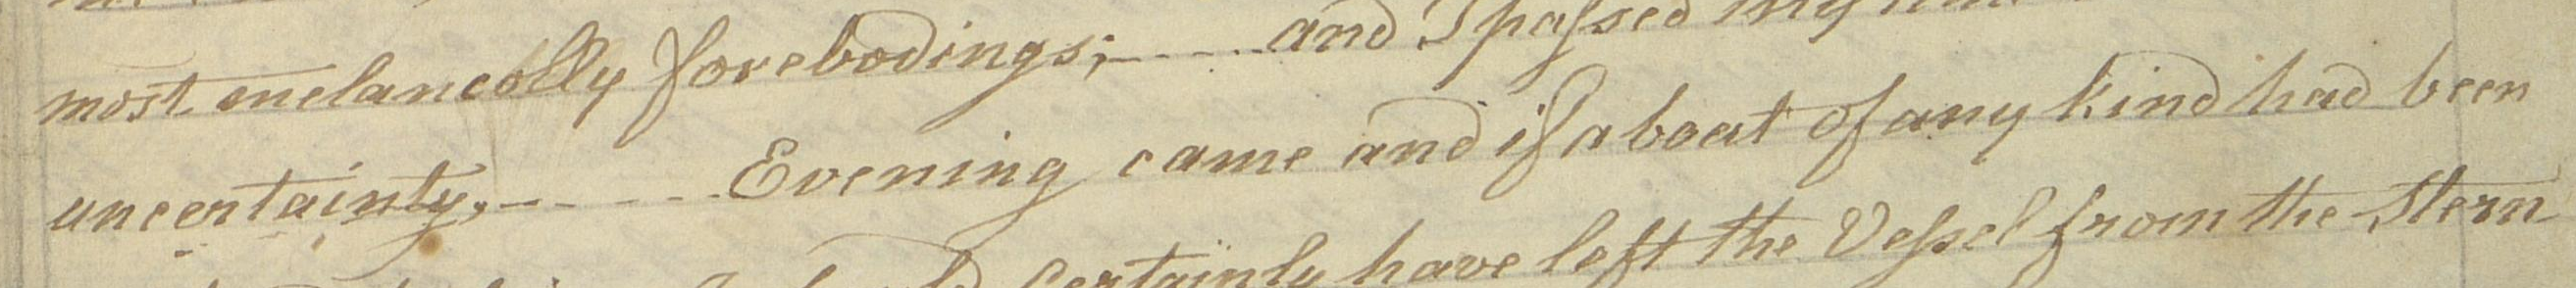uncertainty, Evening came and if about of any kind had been
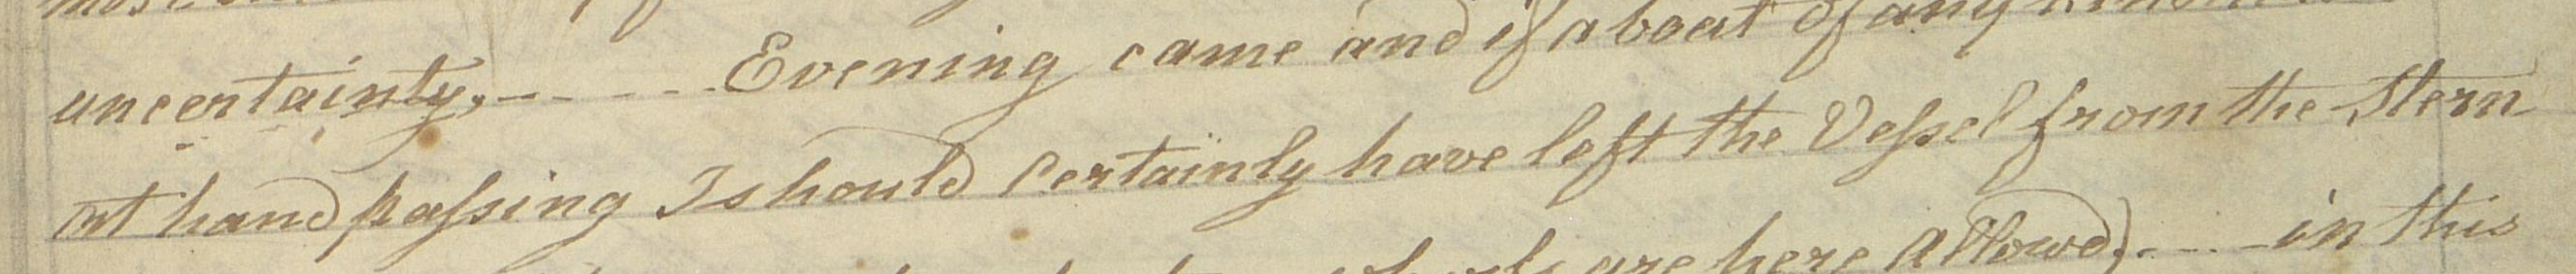at hand passing I should certainly have left the Vessel from the Stern
